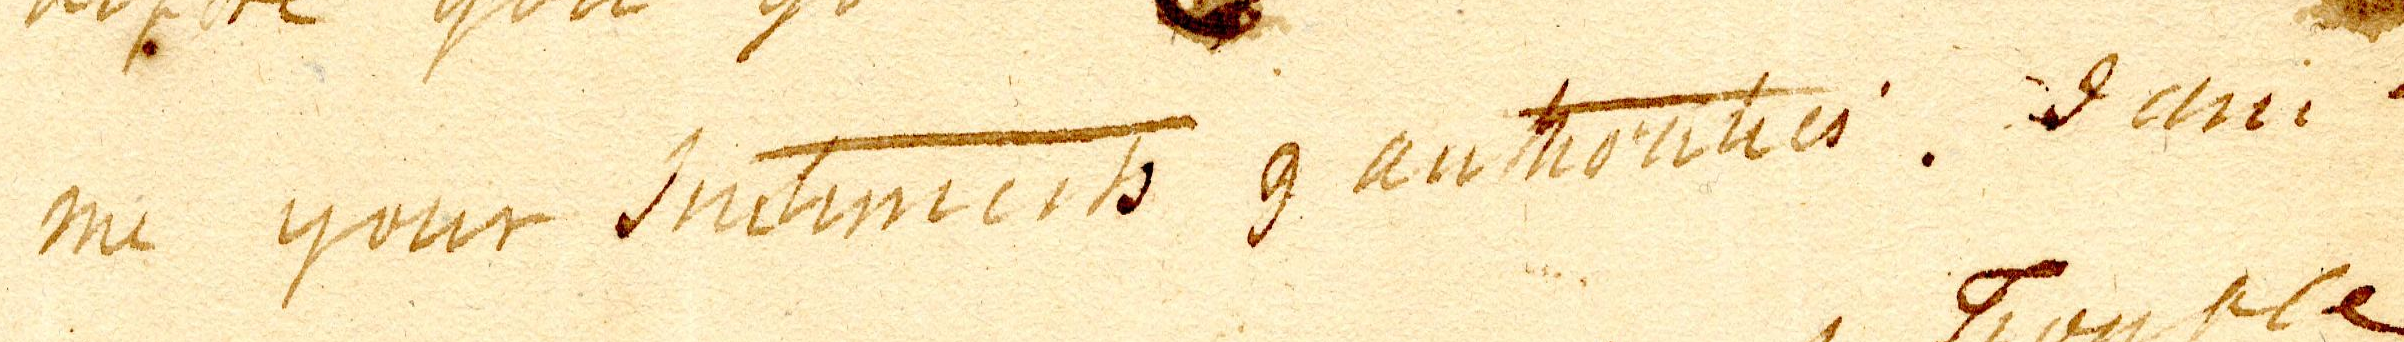me your sentiments & authorities. I am
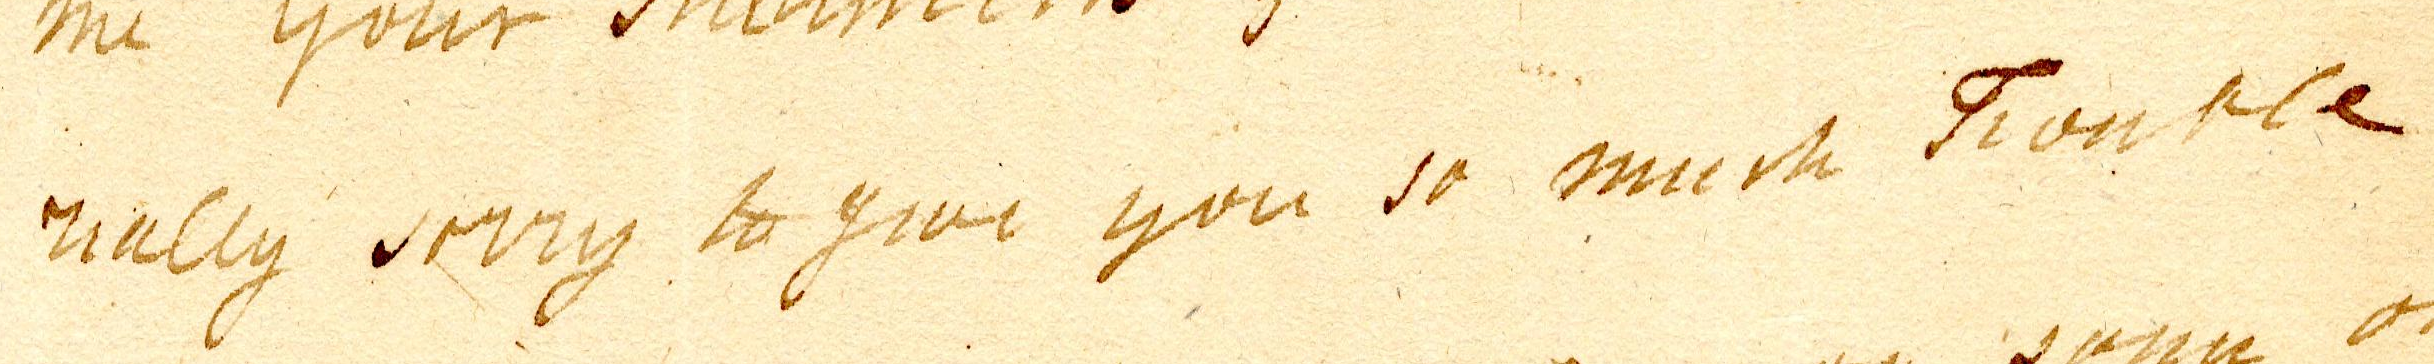really sorry to give you so much Trouble
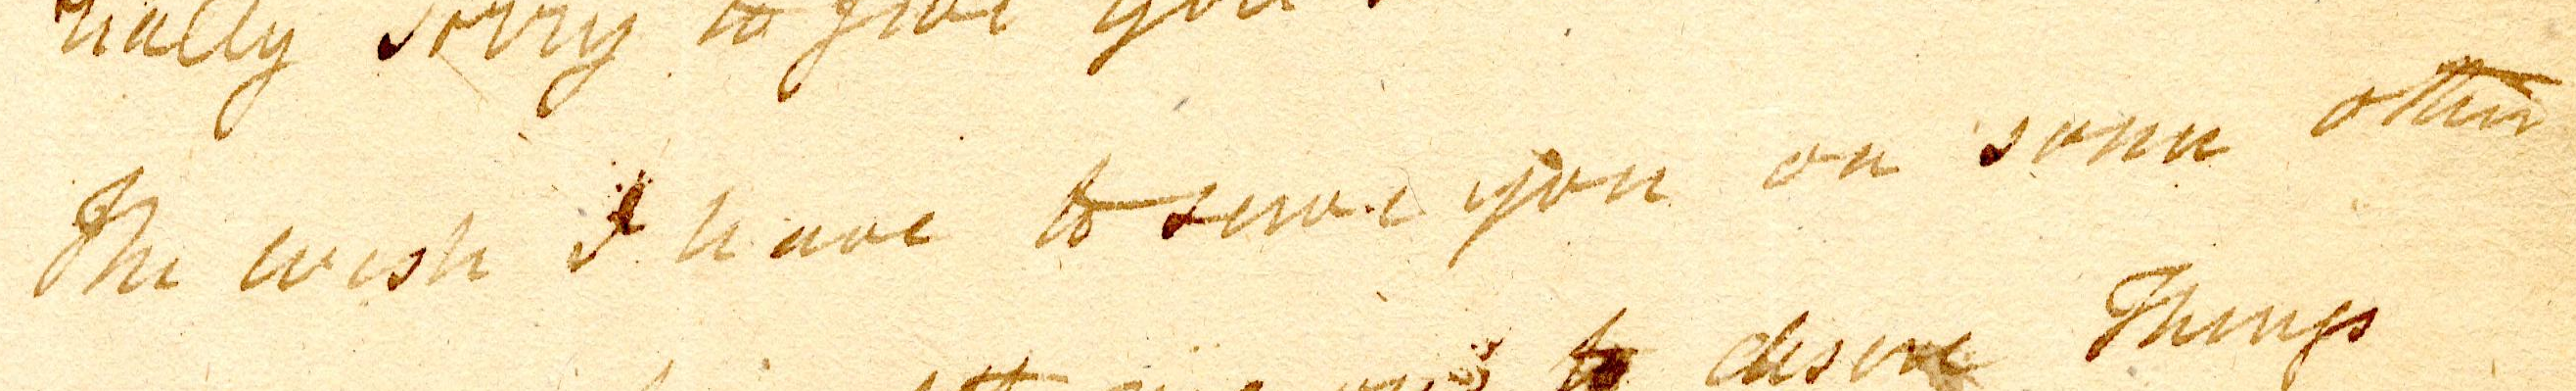The wish I have to serve you on some other
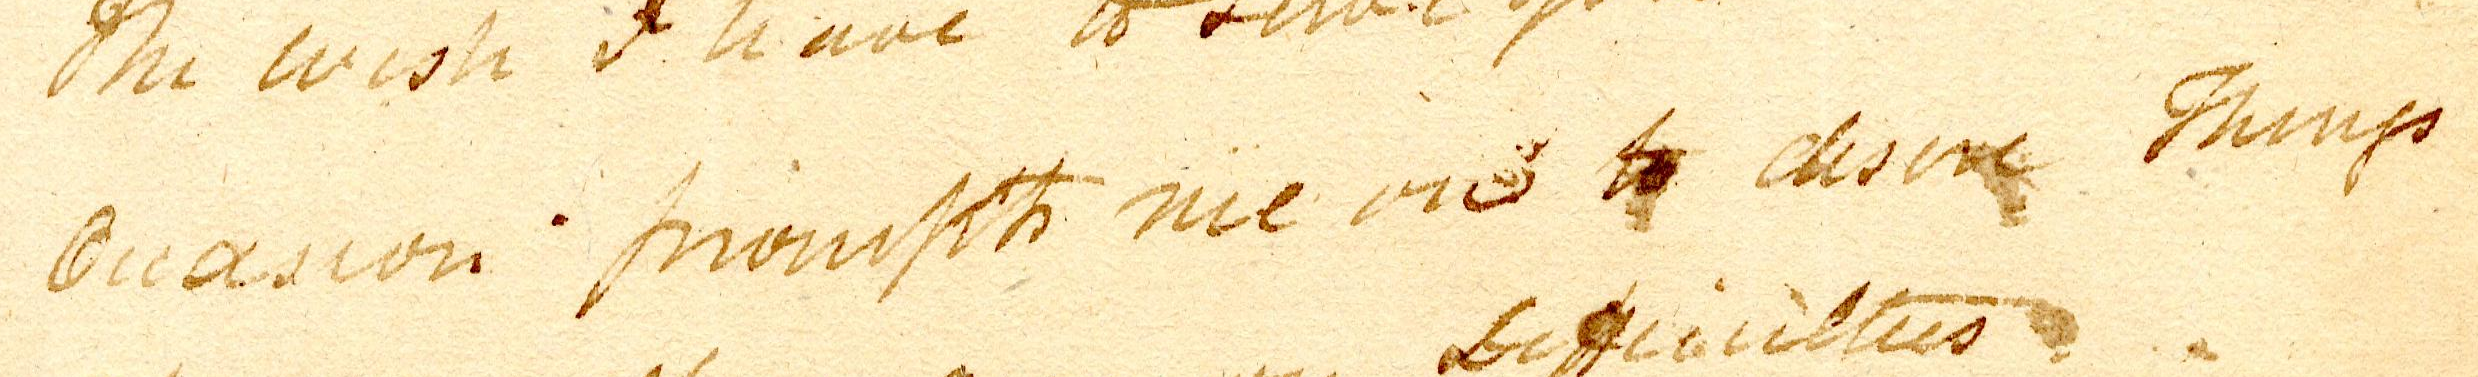Occasion prompts me on to desire Things
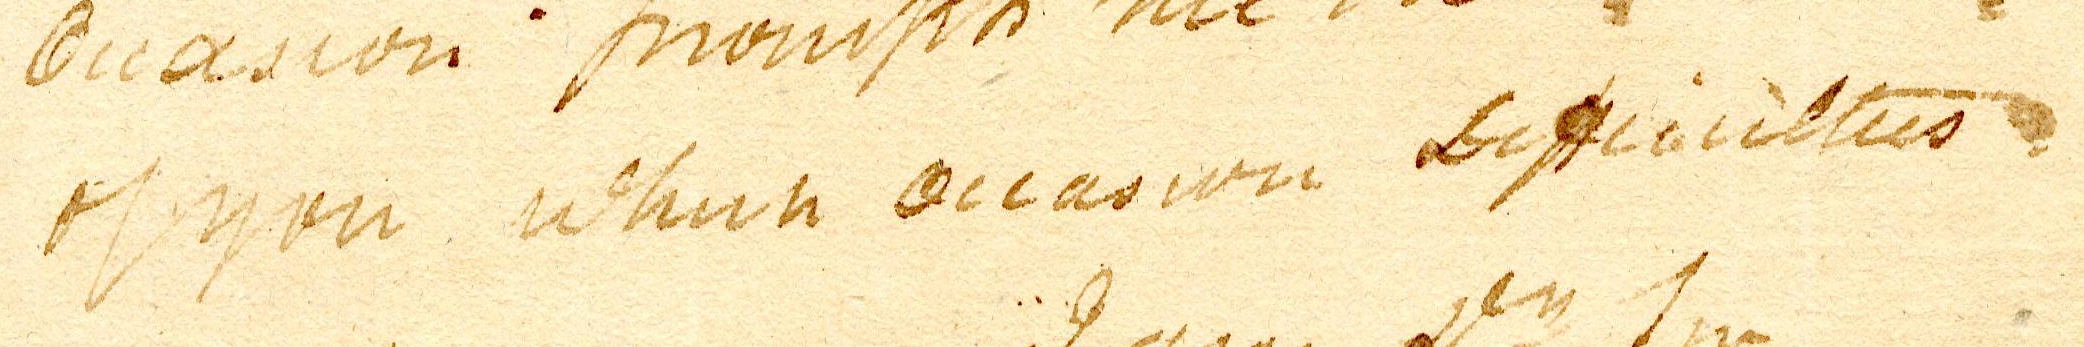of you which occasion Specialties
